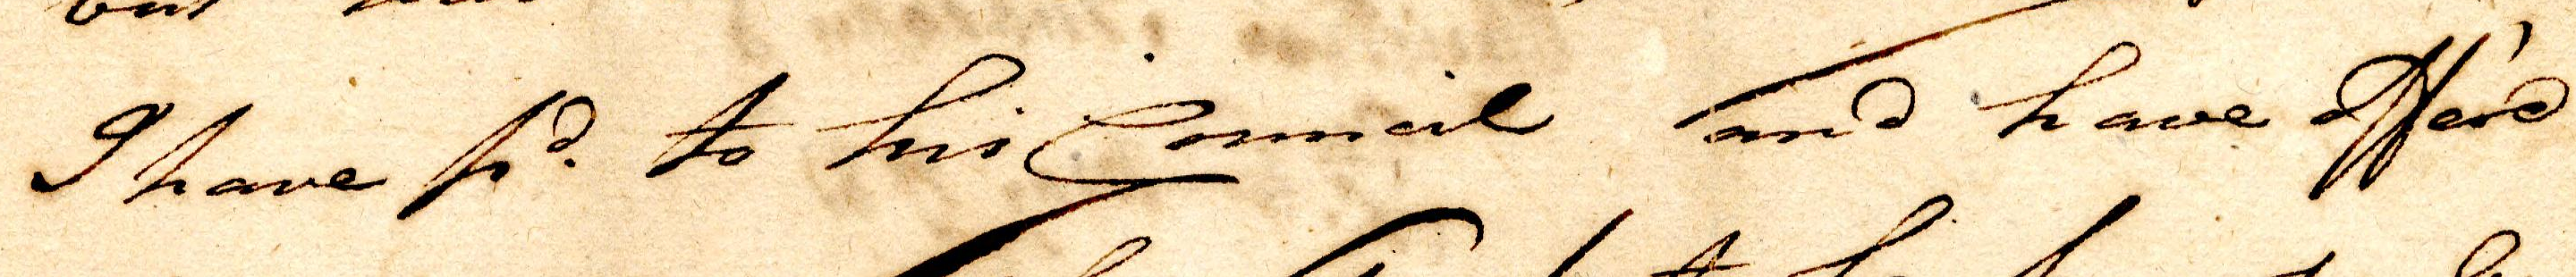I have p^d. to his Council and have offer'd
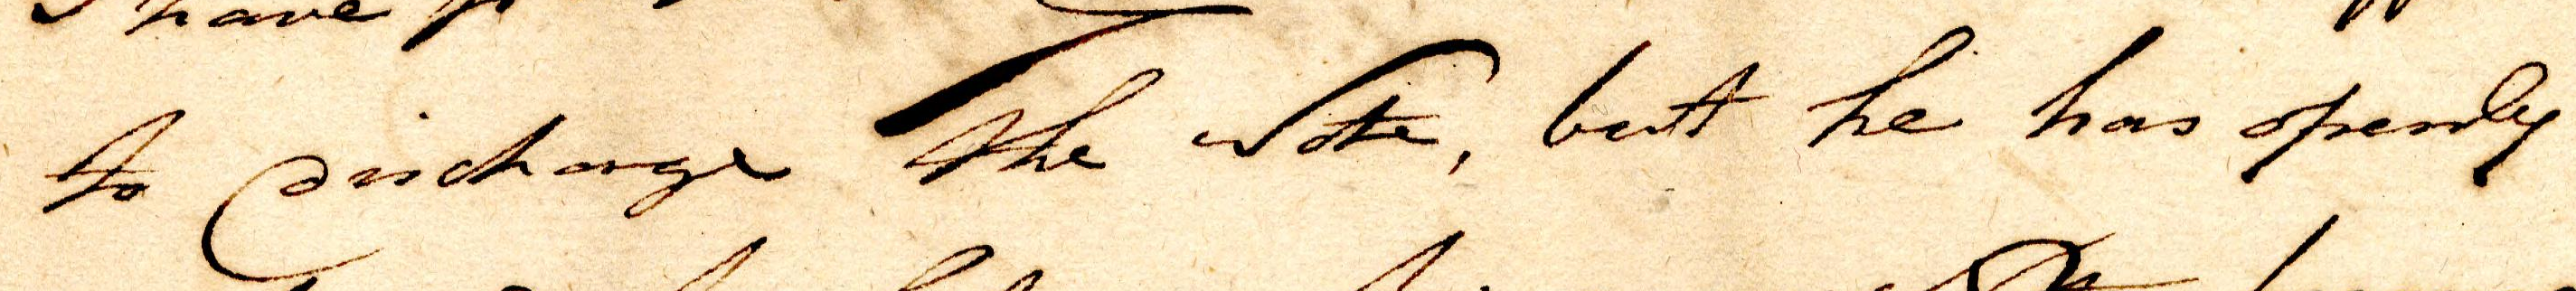to discharge the note, but he has openly
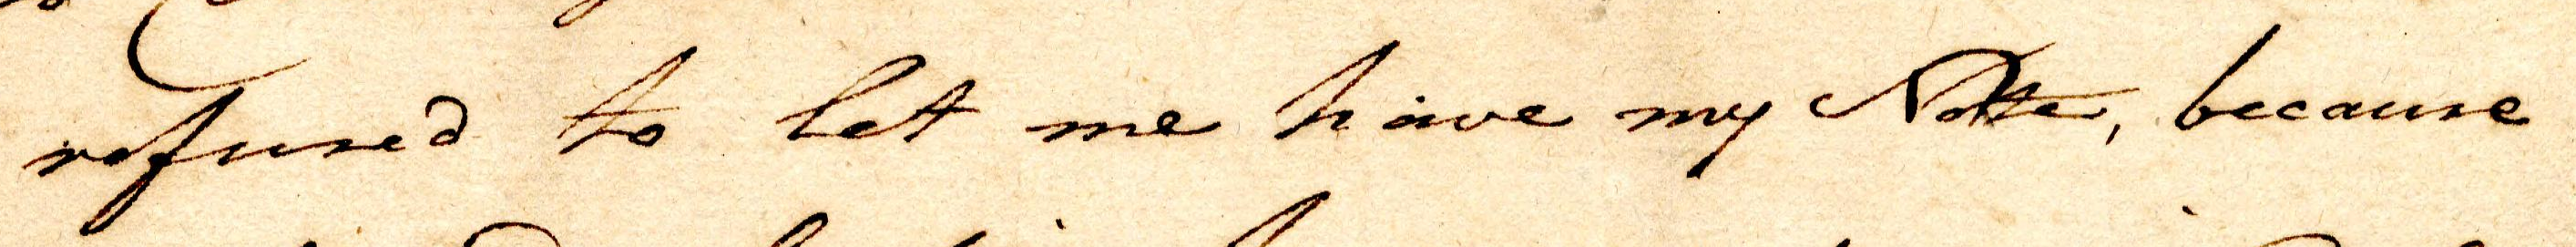refused to let me have my Note, because
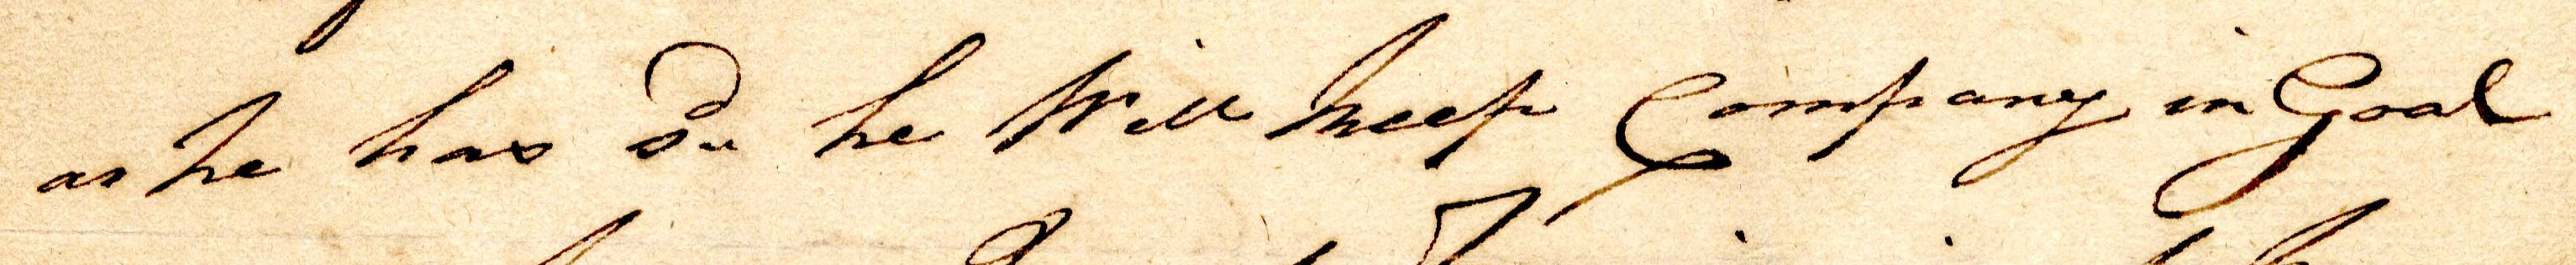as he has s^d he will keep Company in Goal
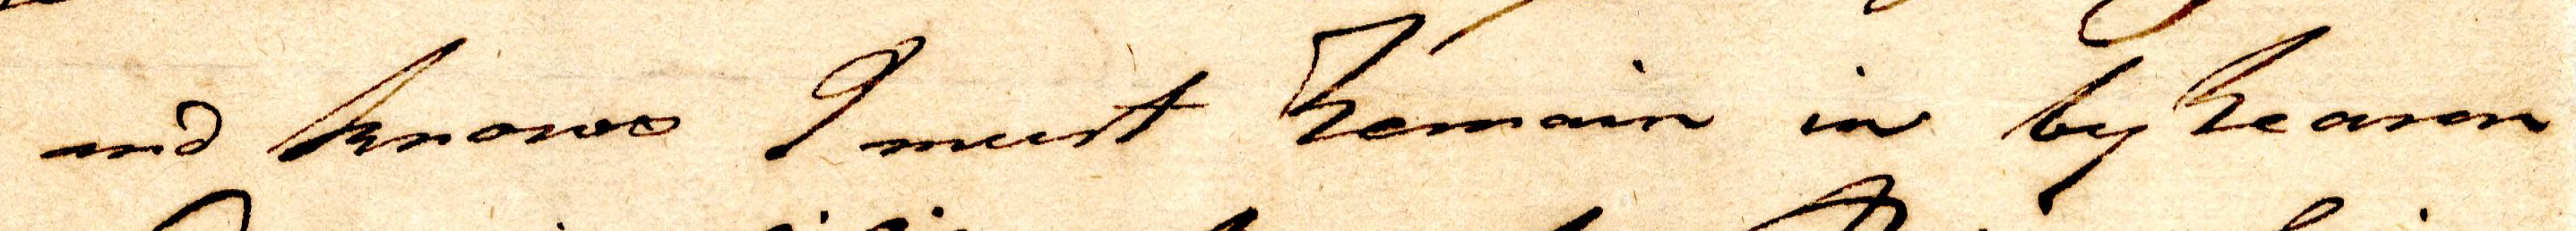and knows I must remain in by hearon
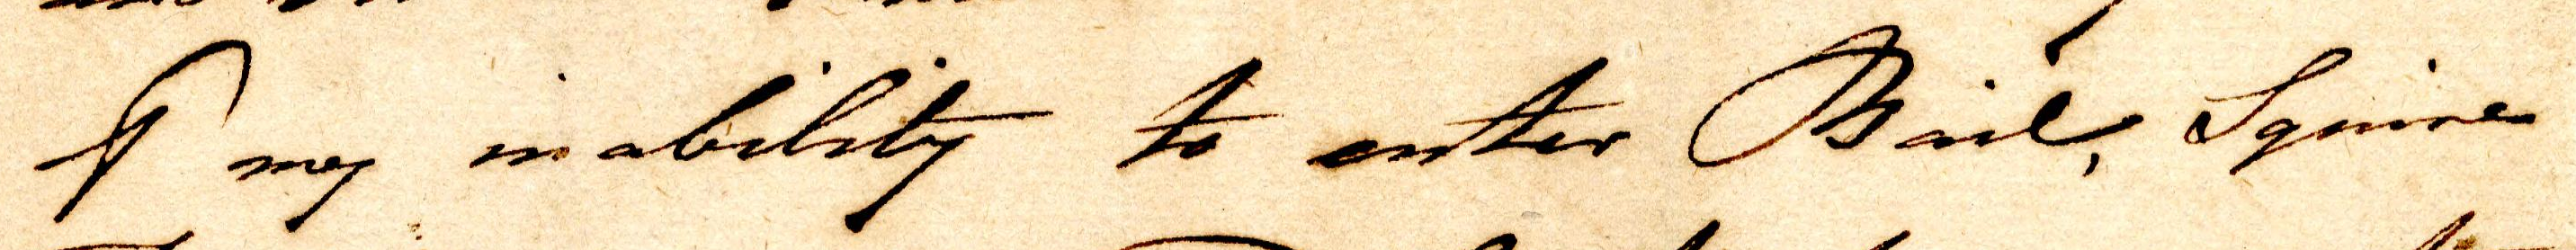& my inability to enter Bail, Squire
